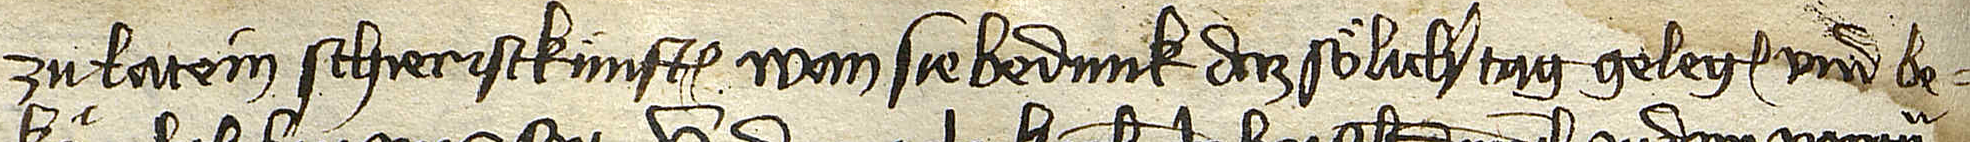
ʒu latein ſchieriſt künft* wan ſie bedunk daʒ ſölich* tag geleg* vnd be=
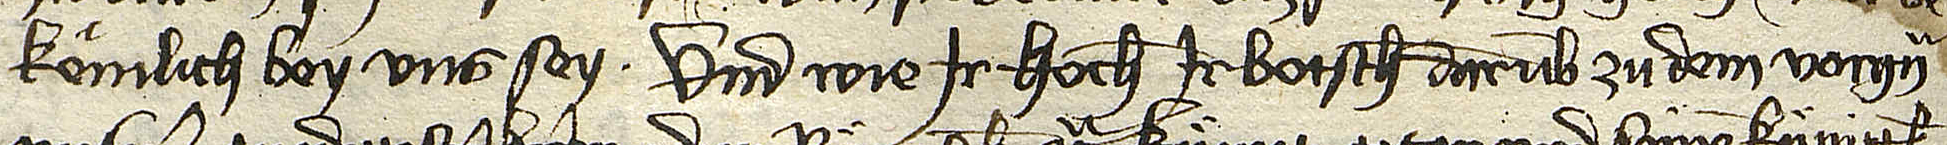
këmlich bey vns ſey . Vnd wie Ir hoch* Ir botſch* daru*b ʒu dem vorg*n
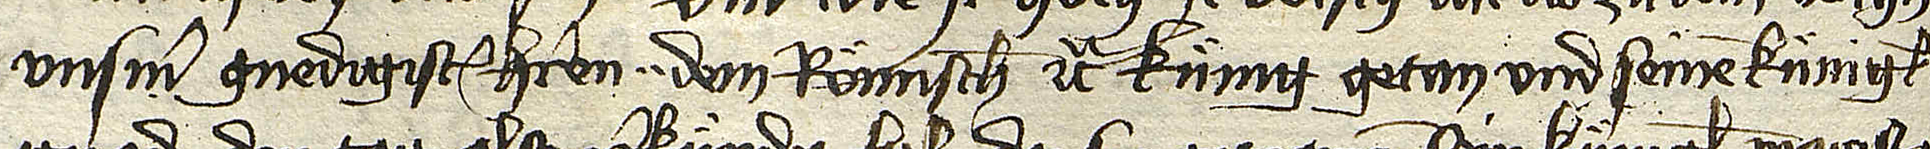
vnſ*m gnedigiſt* h*ren ~ dem Römiſch* ec* künig getan vnd ſeine künigl*
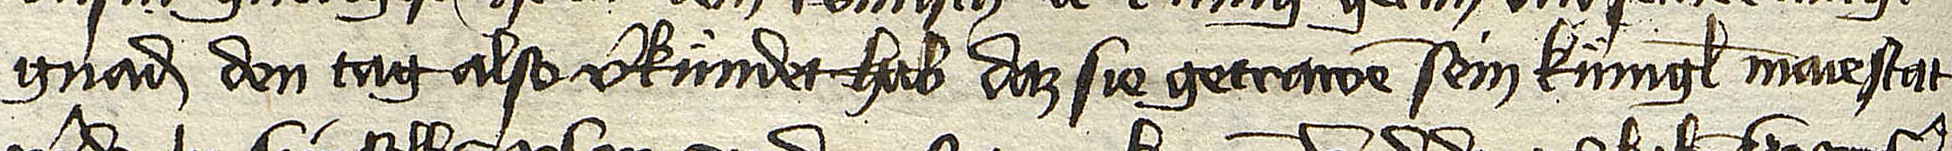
gnad* den tag alſo v*kündet hab daʒ ſie getrawe* ſein künigl* maieſtat
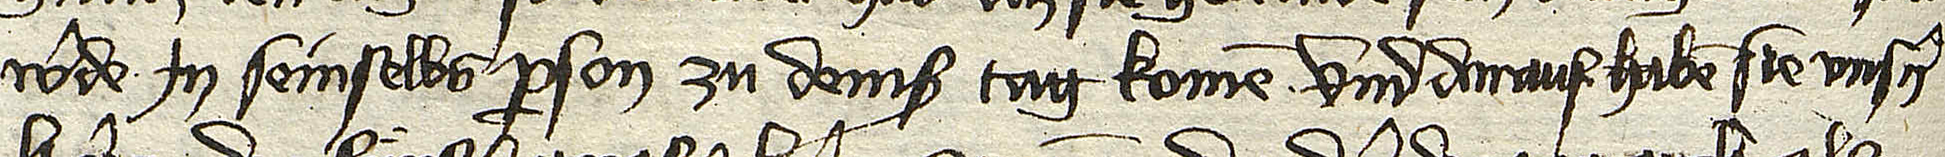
w*de . In ſeinſelbs p*ſon ʒu demſ* tag kome* . Vnd darauf habe* ſie vnſ*n
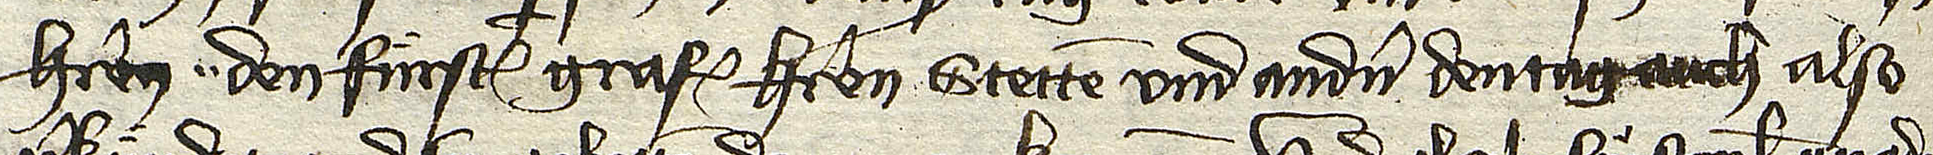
h*ren ~ den fürſt* graf* h*ren Stette* vnd and*n den tag auch alſo
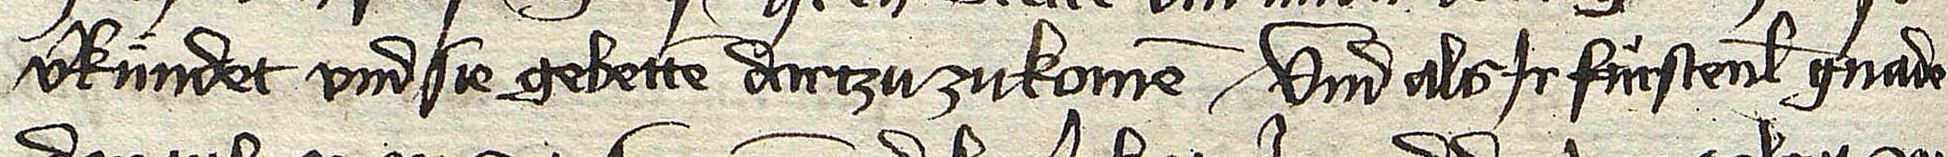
v*kündet vnd ſie gebette* darcʒu ʒukome* / Vnd als Ir fürſtenl* gnade
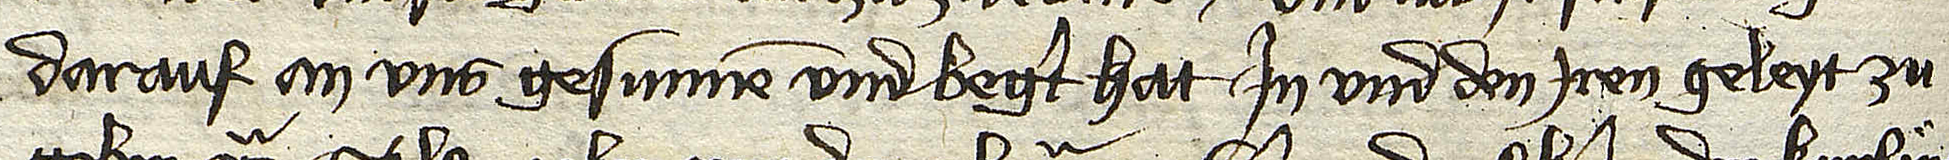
darauf an vns geſunne* vnd beg*t hat / In vnd den Iren geleyt ʒu
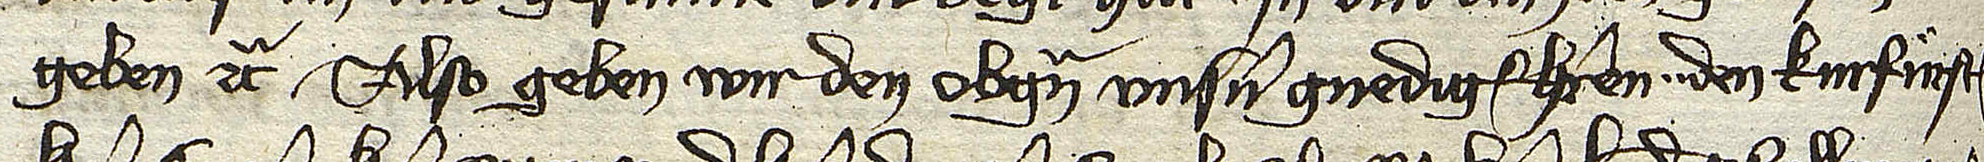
geben ec* / Alſo geben wir den obg*n vnſ*n gnedig* h*ren ~ den kurfürſt*
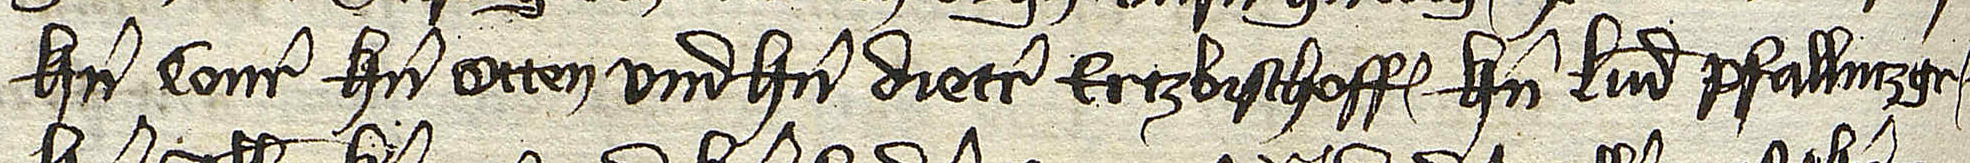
h*n Conr* h*n Otten vnd h*n dietr* Ercʒbiſchoff* h*n lud* pfallncʒgr*
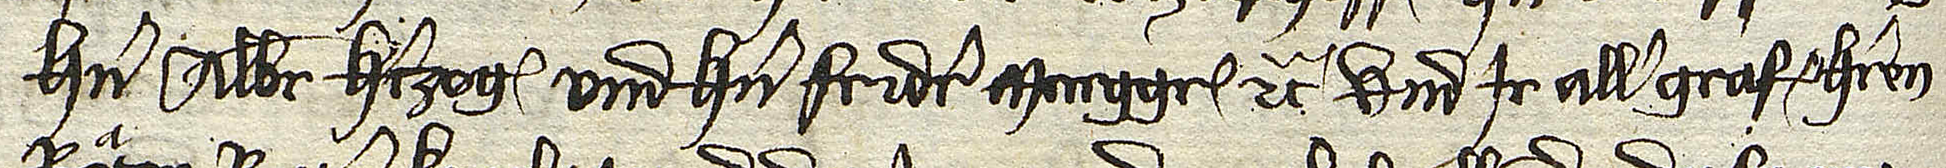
h*n Albr* h*cʒog* vnd h*n fridr* Marggr* ec* Vnd Ir all* graf* h*ren
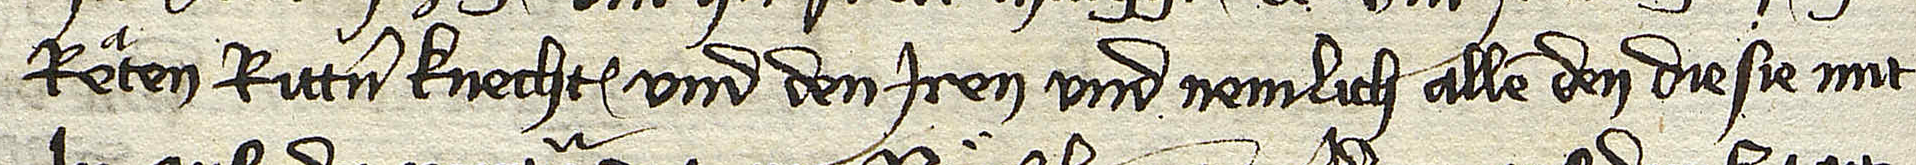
Rëten Ritt*n knecht* vnd den Iren vnd nemlich alle* den die ſie mit
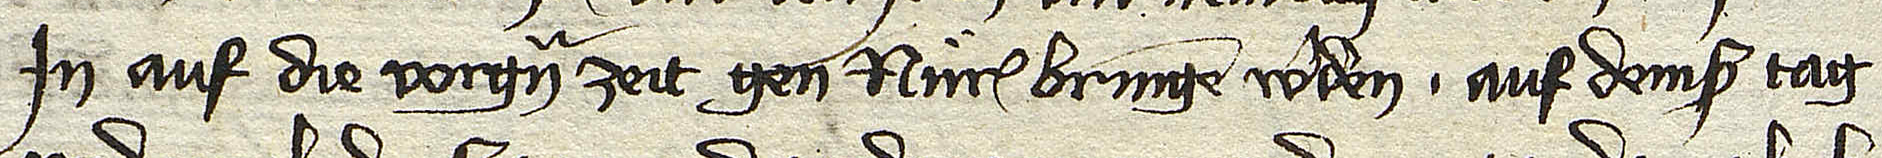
In auf die vorg*n ʒeit gen Nür* bringe* w*den . auf demſ* tag
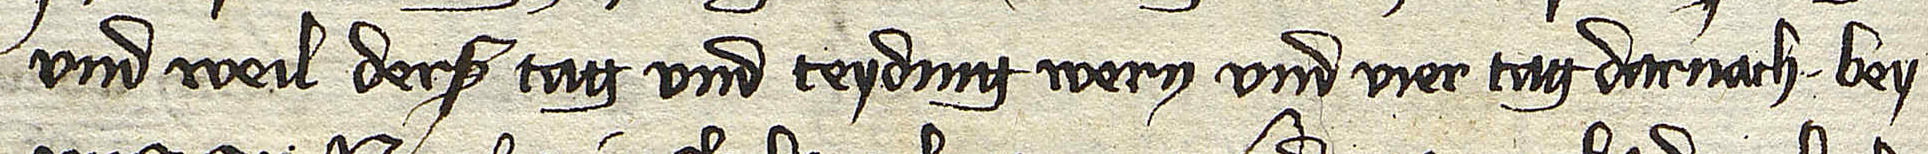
vnd weil derſ* tag vnd teyding wern vnd vier tag darnach . bey
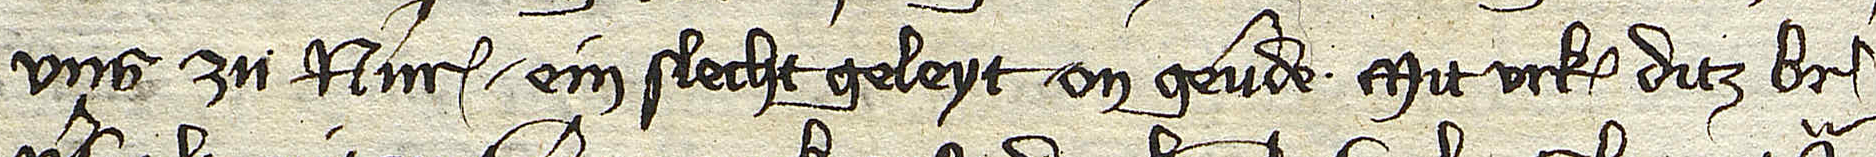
vns ʒu Nür* / ein ſlecht geleyt on geu*de . Mit vrk* dicʒ br*
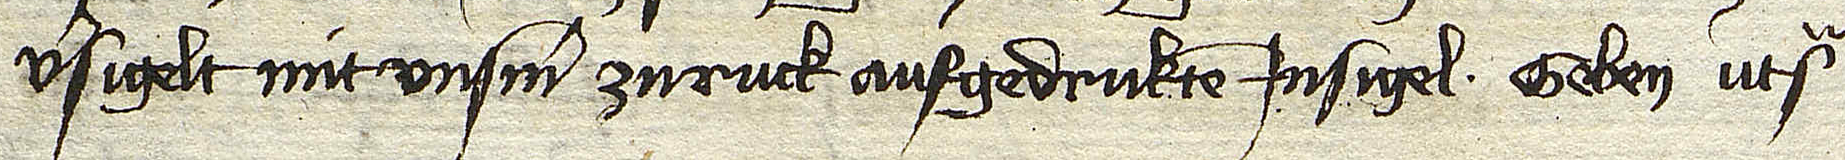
v*ſigelt mit vnſ*m ʒuruck aufgedrukte* Inſigel . Geben ut ſ*
